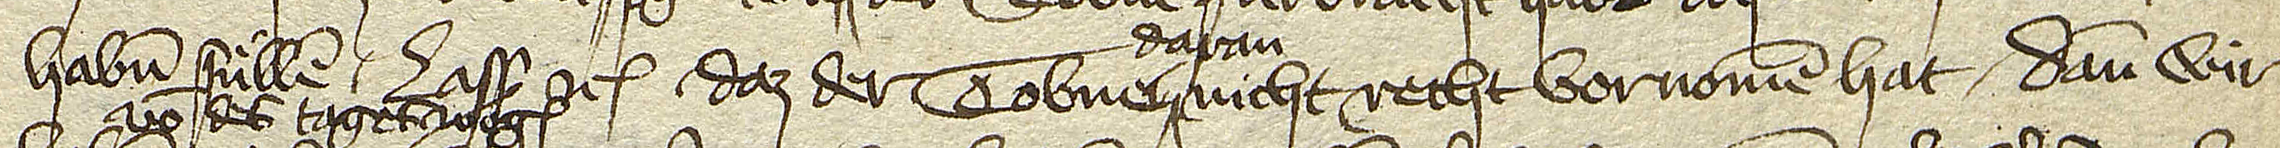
habn* ſülle* / Laſſ* ec* / daʒ der Tobner nicht recht vernome* hat / dan* wir
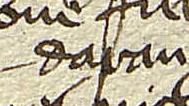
daran
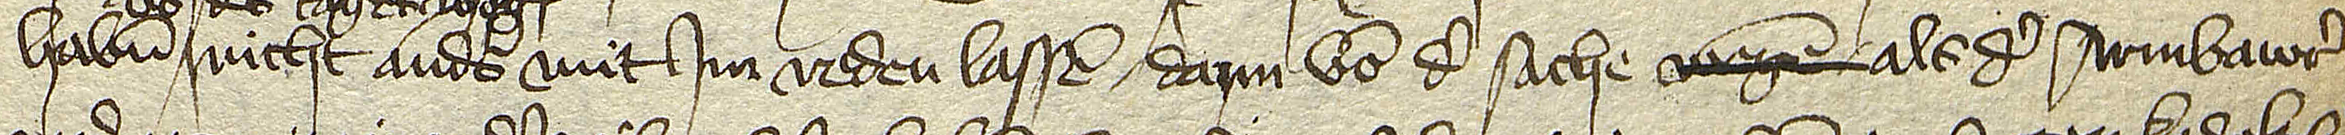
habn* nicht ands* mit Im reden laſſe* / dann vo* d* ſache wege* / als d* Armbawr*
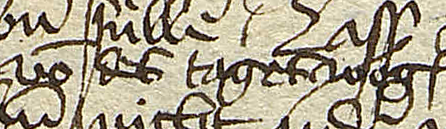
vo* des tages weg*
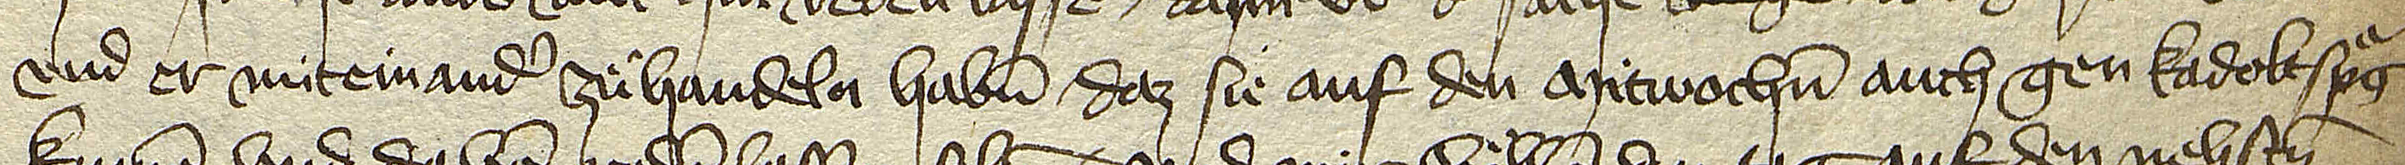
vnd er miteinand* cʒü handeln habn* / daʒ ſie auf den Mitwochn* auch gen kadoltſpg*
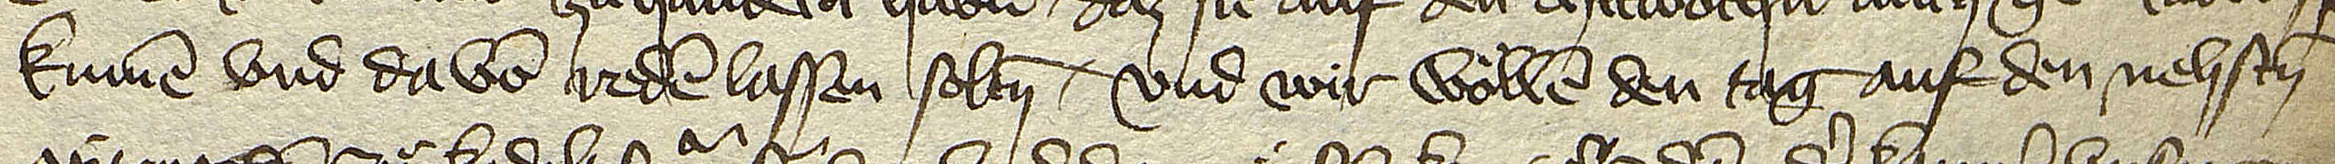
kume* vnd davo* rede* laſſen ſoltn* / vnd wir wölle* den tag auf den nehſtn*
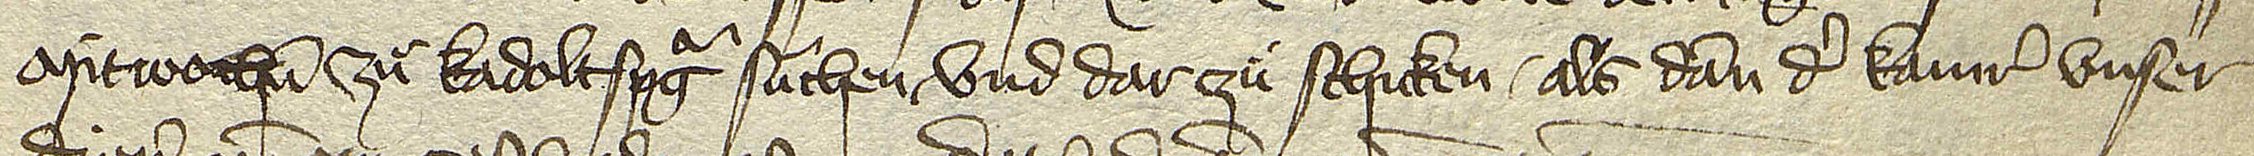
Mitwochn* cʒü kadoltſpg* ſüchen / vnd dar cʒü ſchicken / als dan* d* kamr* vnſer
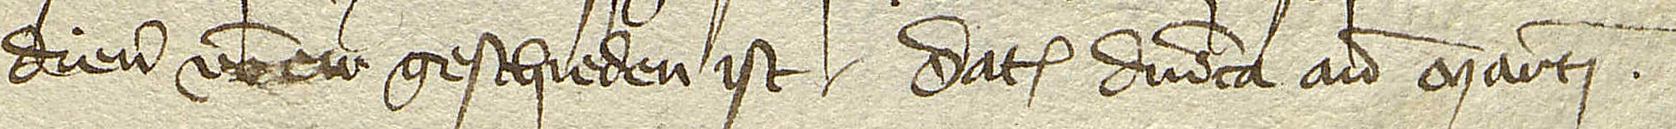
dien* vo* ew geſchieden iſt / Dat* dmca* an* Marti* .
